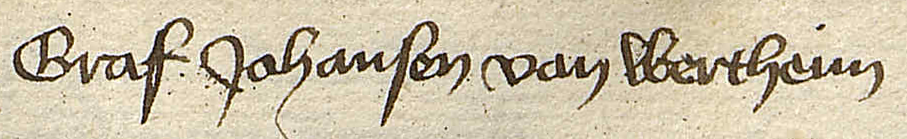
Graf Iohanſen von Wertheim
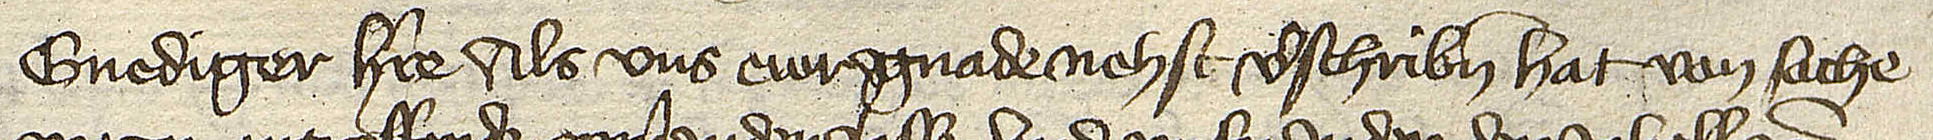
Gnediger h*re Als vns ewr* gnade nehſt v*ſchribn* hat von ſache
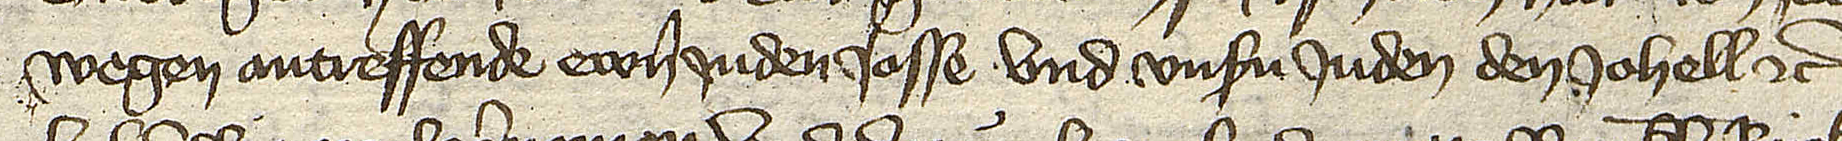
wegen antreffende ewn* Iuden Ioſſe . Vnd vnſ*n Iuden den Iohell ec*
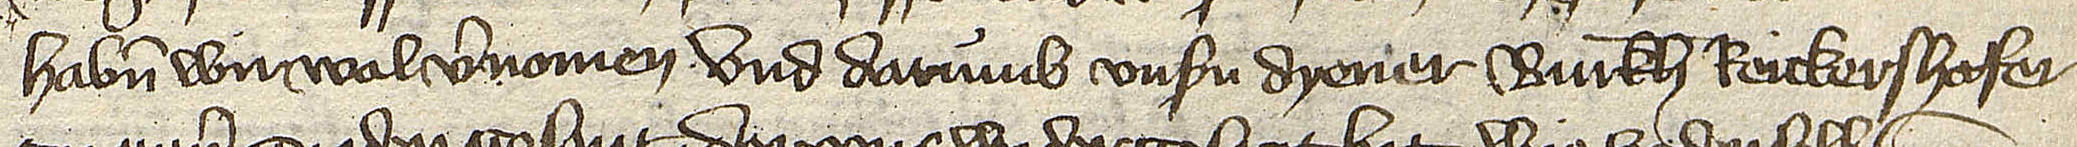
habn* wir wol v*nomen . Vnd darümb vnſ*n dyener Burkh* Reickerſhofer
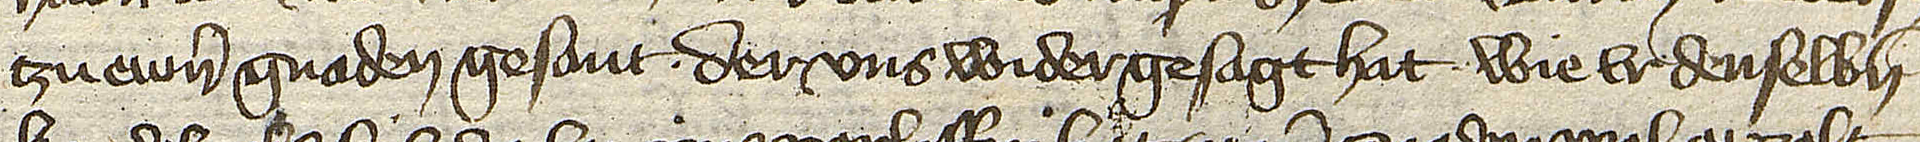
cʒu ewn* gnaden geſant . der vns widergeſagt hat . wie Er denſelbn*
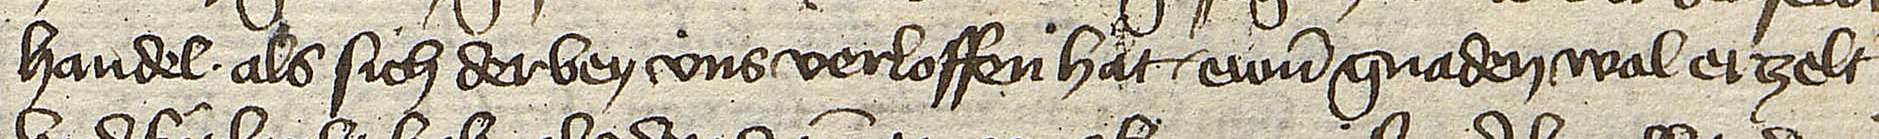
handel . als ſich der bey vns verloffen hat / ewn* gnaden wol ercʒelt
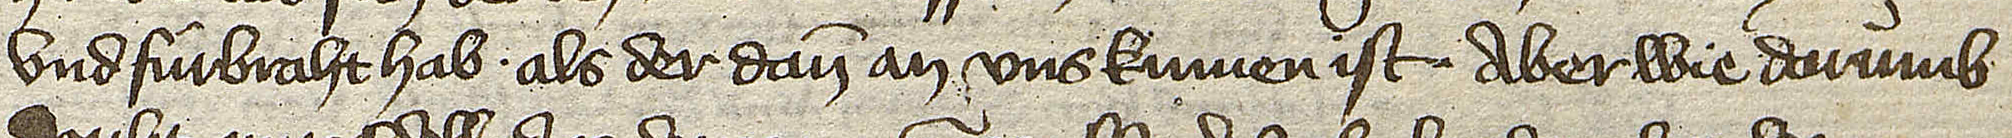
vnd fürbraht hab . als der dan* an vns kumen iſt . Aber wie darümb
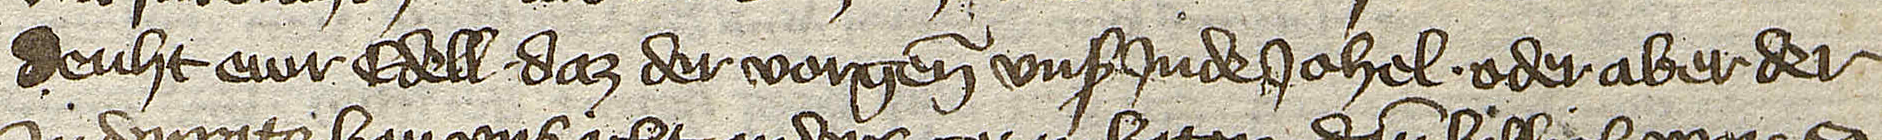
deuht ewr Edell / daʒ der vorgen* vnſ* Iude Iohel . oder aber der
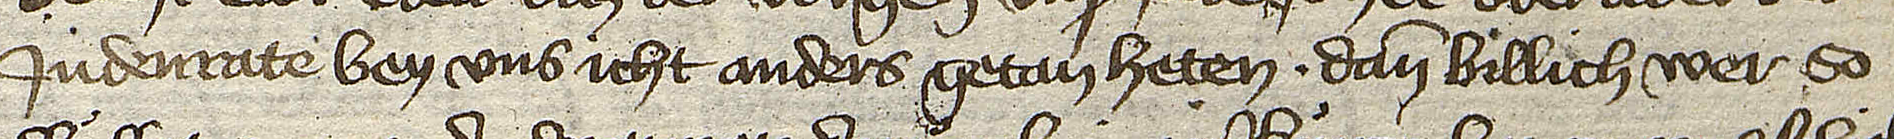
Iudenrate bey vns icht anders getan heten . dan* billich wer So
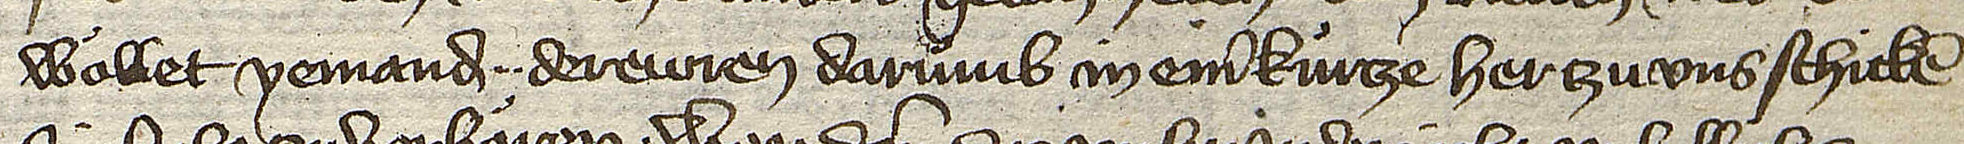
wöllet yemand* ~ der ewren darümb in ein* kürcʒe her cʒu vns ſchicke*
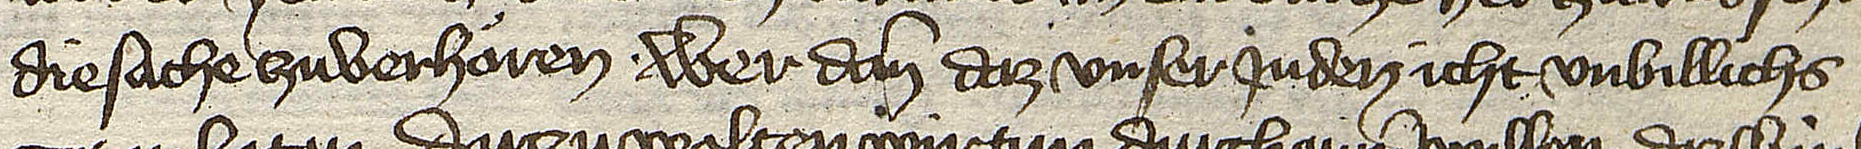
die ſache cʒuverhören . Wer dan* daʒ vnſer Iuden icht vnbillichs
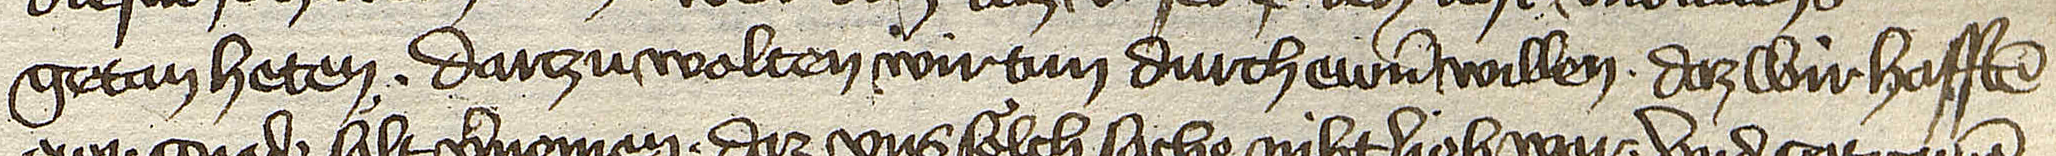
detan heten . Darcʒu wolten wir tun durch ewn* willen . daʒ wir hoffe*
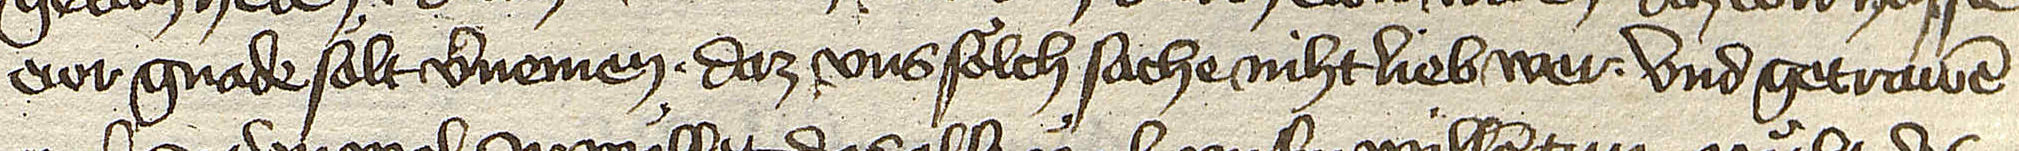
ewr gnade ſölt v*nemen / daʒ vns ſölch ſache niht lieb wer . Vnd getrawe*
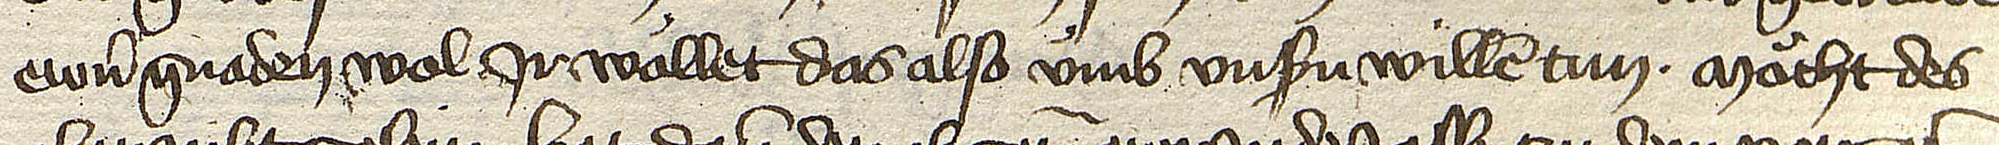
ewn* gnaden wol Ir wöllet das alſo v̈mb vnſ*n wille* tun . Möcht des
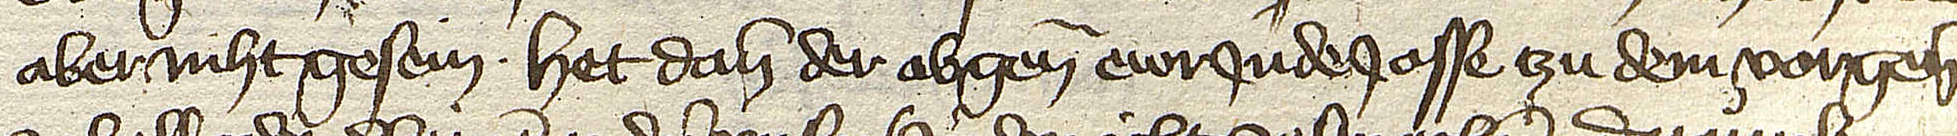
aber niht geſein . het dan* der obgen* ewr Iude Iuſſe cʒu dem vorgen*
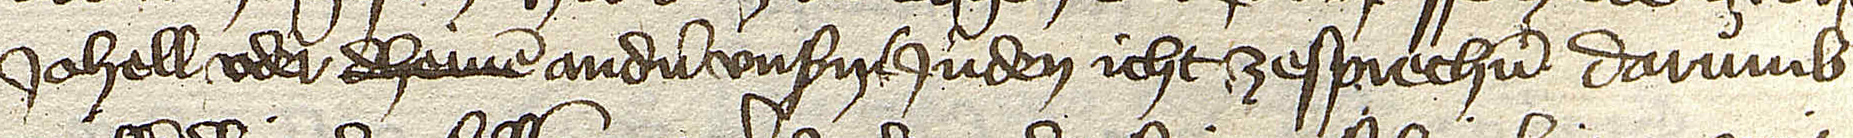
Iohell oder dheine* andn* vnſ*m Iuden icht cʒeſprechn* darümb
